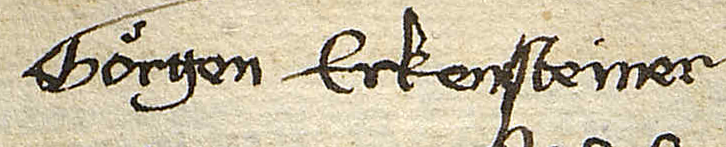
Görgen Erkenſteiner
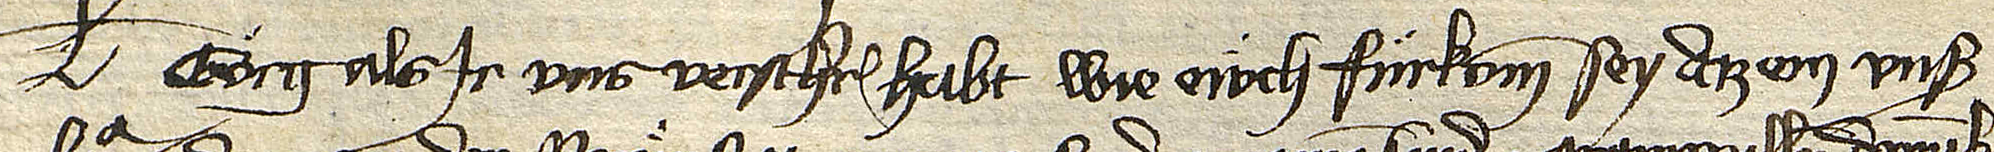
L* Görg als Ir vns verſchr* habt wie ewch fürkom* ſey daʒ ein vnſ*
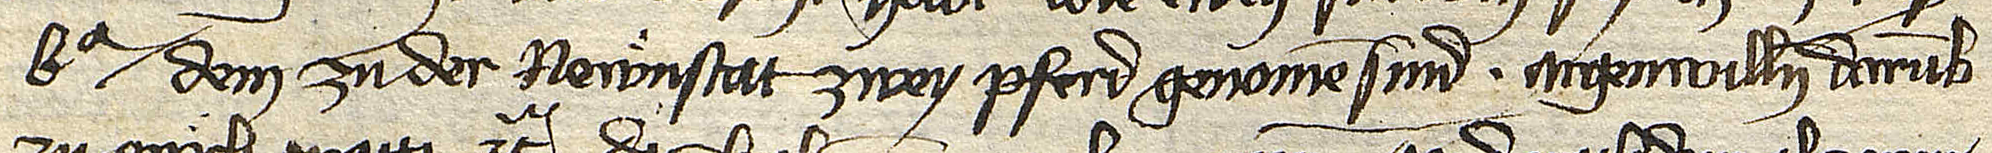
b* / dem ʒu der Newnſtat ʒwey pferd genome* ſind . argenwilln* darub*
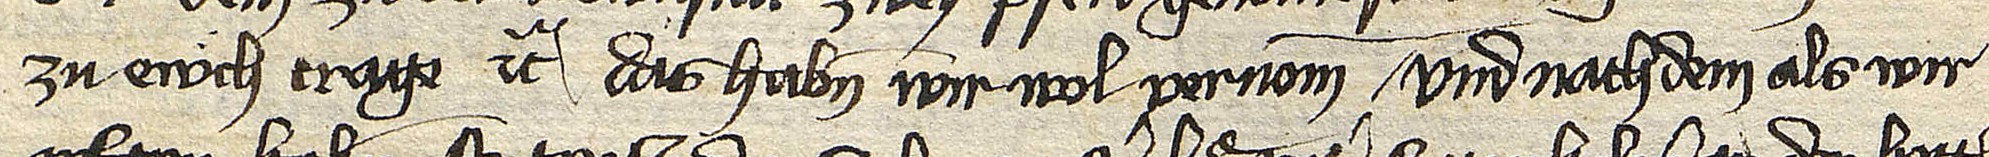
ʒu ewch trage ec* das habn* wir wol vernom* / vnd nachdem als wir
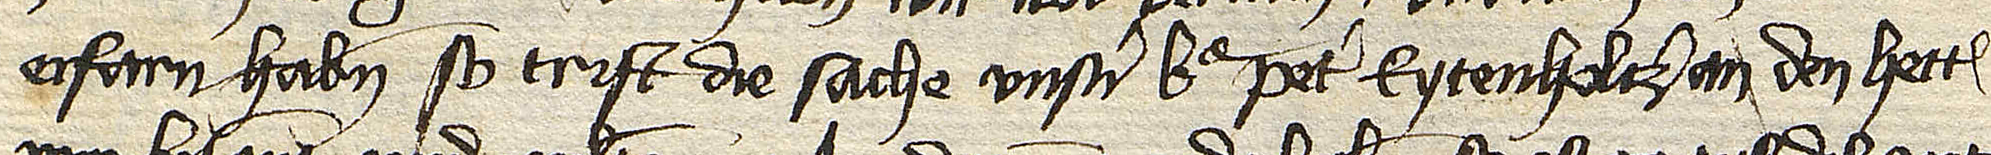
erfarn habn* ſo trift die ſache vnſn b* Pet* Eytenholcʒ* an den hett*
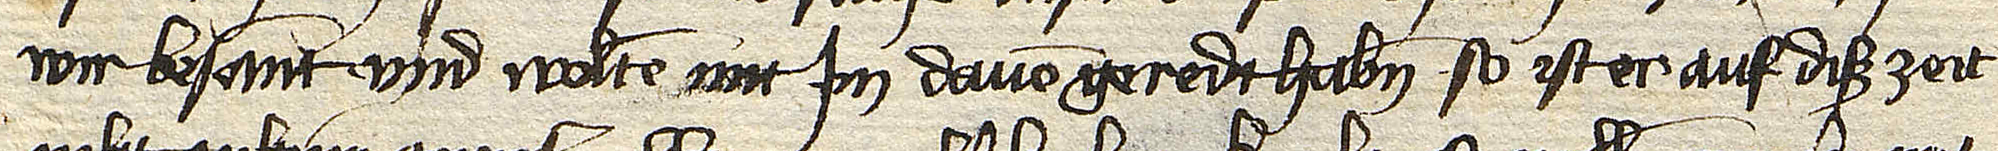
wir beſant vnd wolte* mit Im dauo* geredt habn* . ſo iſt er auf diſ* ʒeit
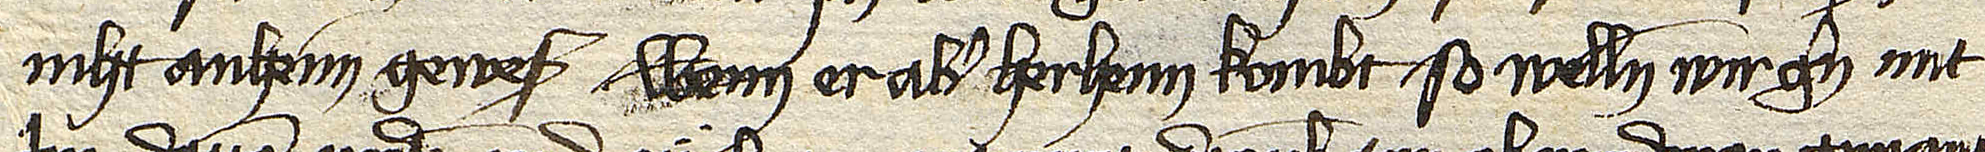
niht anheim geweſ* / Wenn er ab* herheim kombt / ſo welln* wir g*n mit
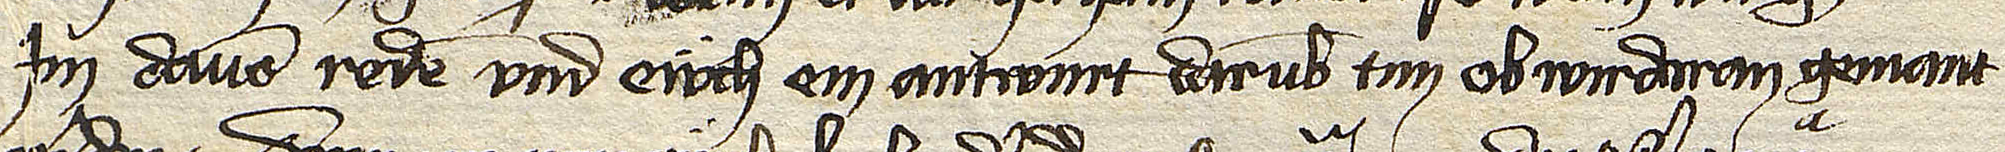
Im dauo* rede* vnd ewch ein antwurt darub* tun ob wir daran gemant
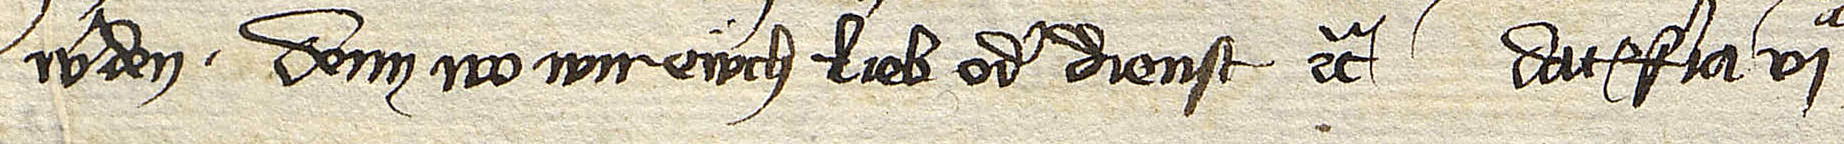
w*den / Denn wo wir ewch lieb od* dienſt ec* Dat* fi*a vi*
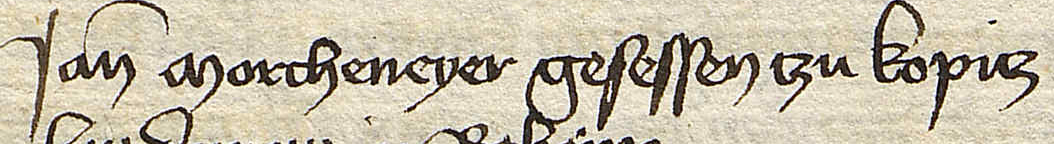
Ian* Morcheneyer geſeſſen cʒu kopicʒ
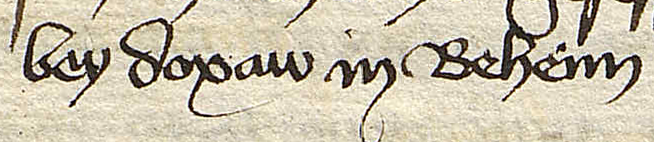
bey Doxaw in Beheim
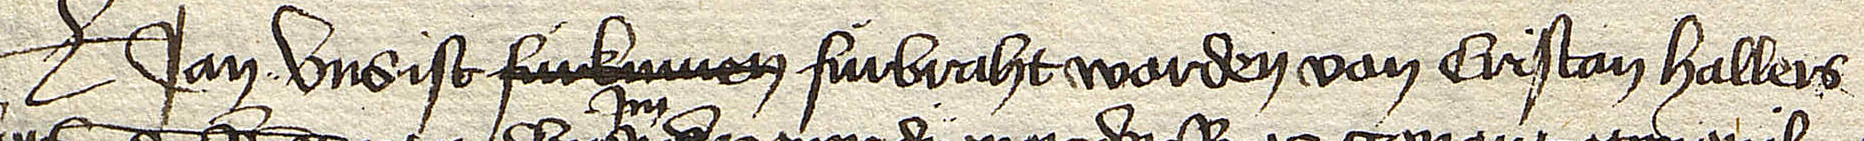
L* Ian vns iſt fürkumen fürbraht worden von Criſtan hallers
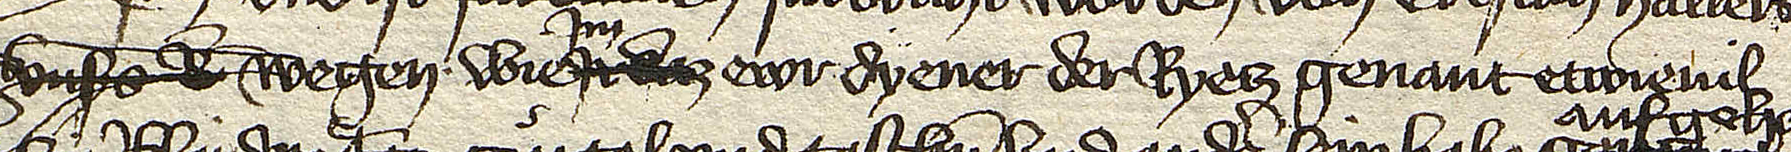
vnſ*s B* wegen . wie Ir daʒ ewr dyener der Ryecʒ genant etwieuil
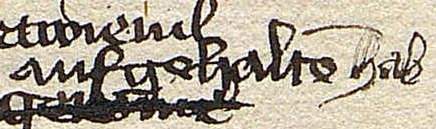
aufgehalte* hab
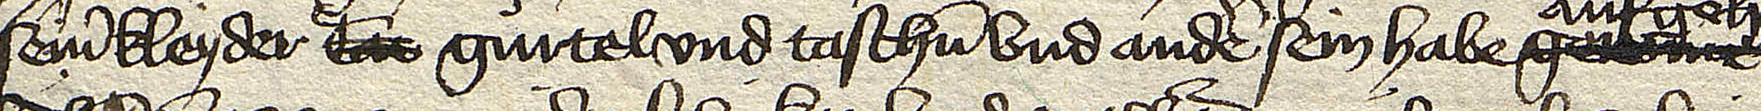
ſein* kleyder Ta gürtel vnd taſchn* vnd ande* ſein habe genome*
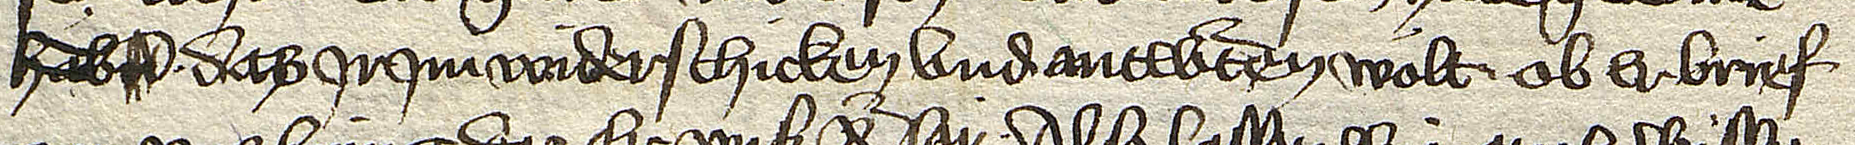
habn* . das Ir Im widerſchicken vnd antw*ten wölt . ob Er brief
